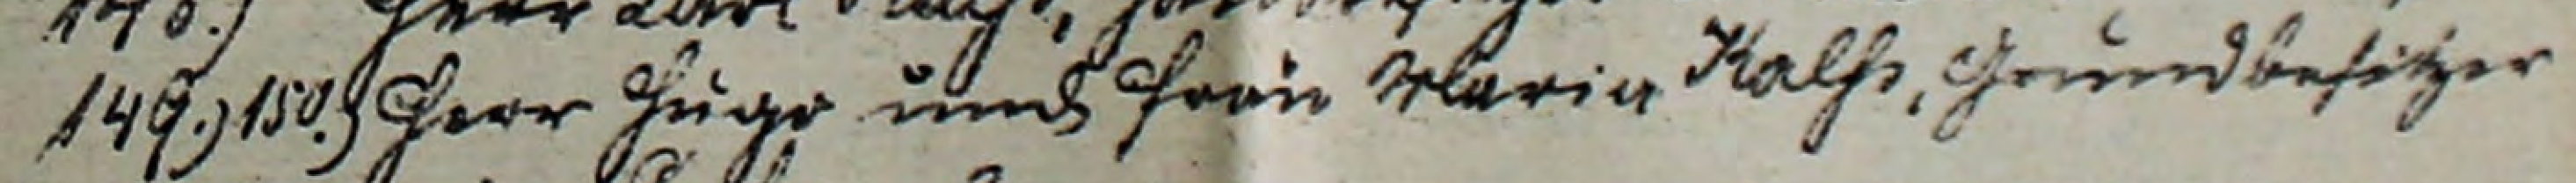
149.) 150.) Herr Hugo und Frau Maria Kalhs, Grundbesitzer
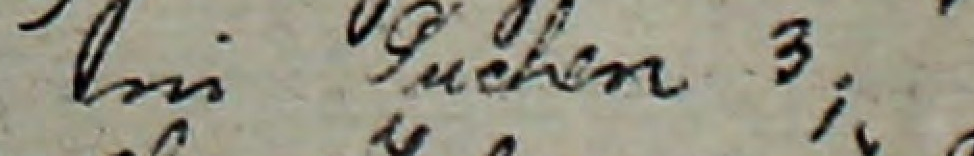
in Puchen 3;
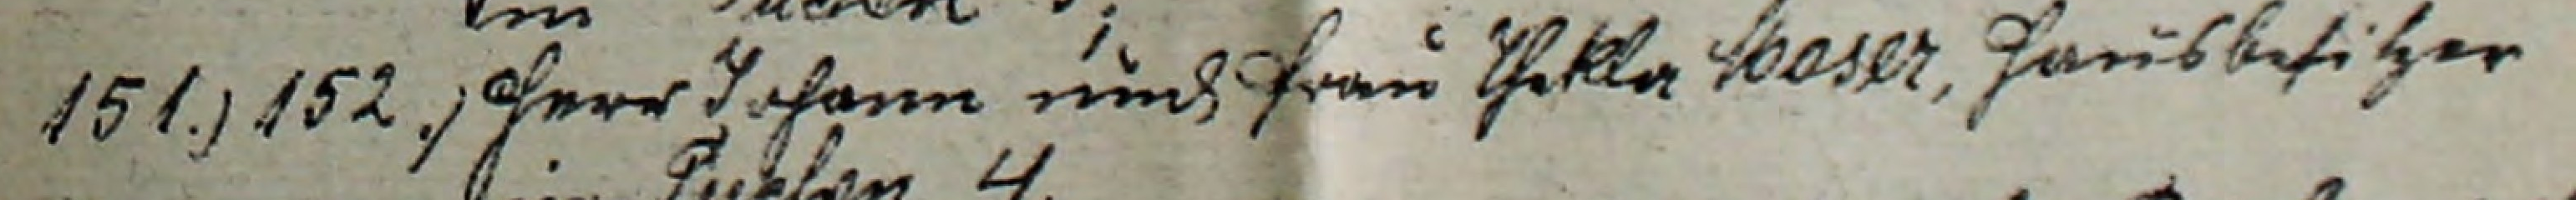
151.) 152.) Herr Johann und Frau Thekla Moser, Hausbesitzer
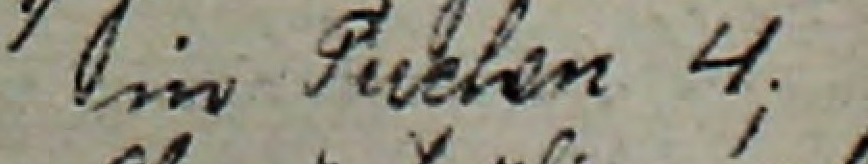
in Puchen 4;
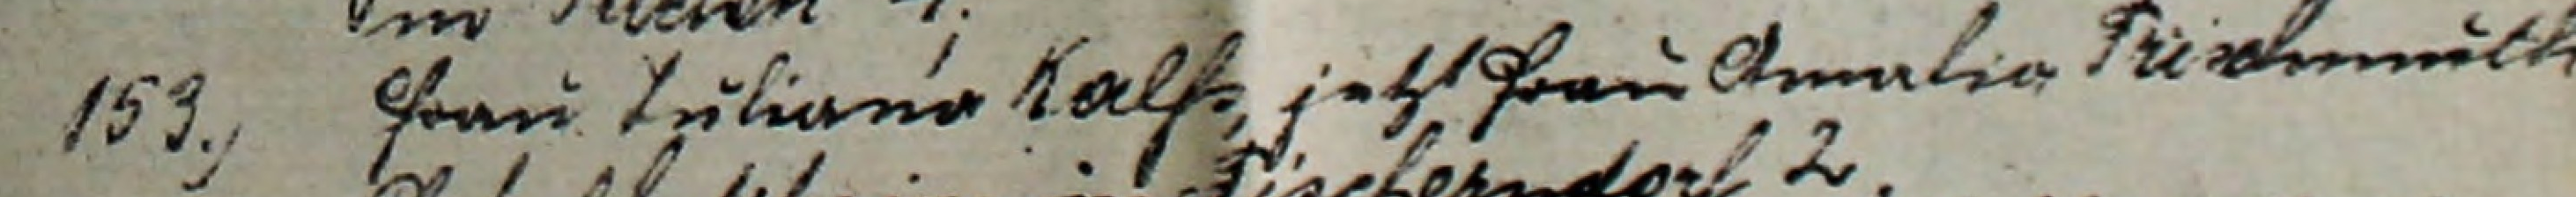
153.) Frau Juliana Kalhs, jetzt Frau Amalia Frischmuth
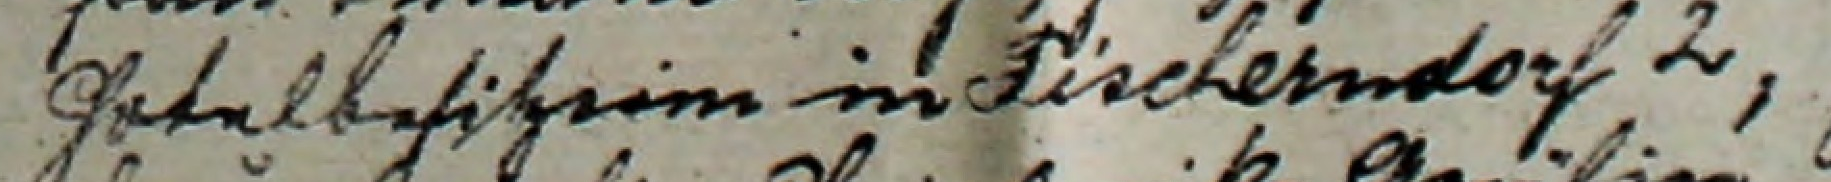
Hotelbesitzerin in Fischerndorf 2;
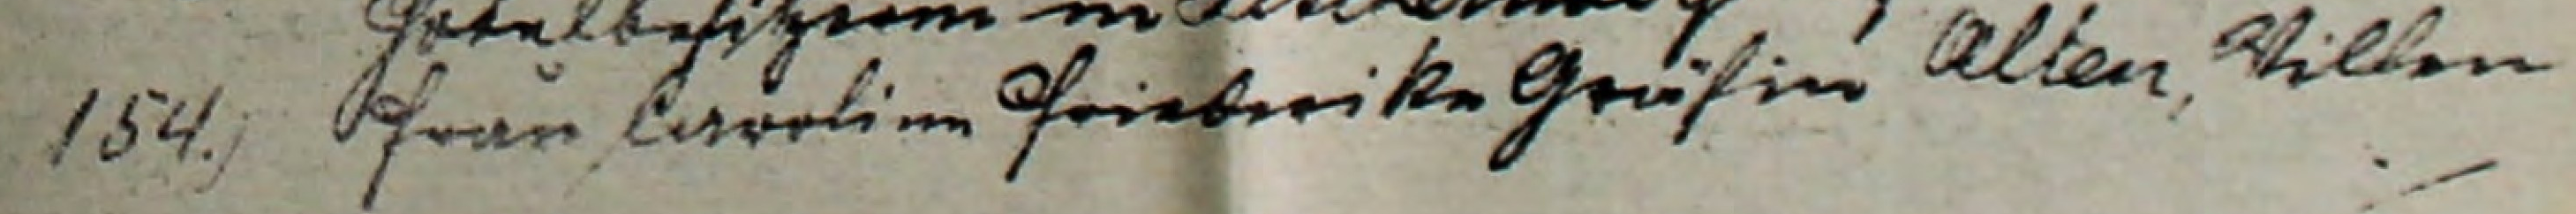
154.) Frau Caroline Friederike Gräfin Alten, Villen
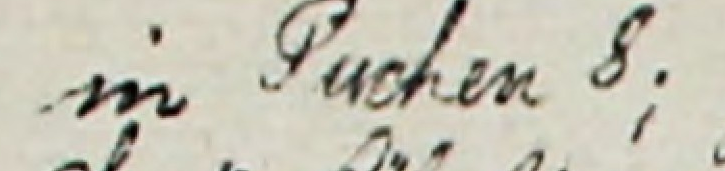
in Puchen 8;
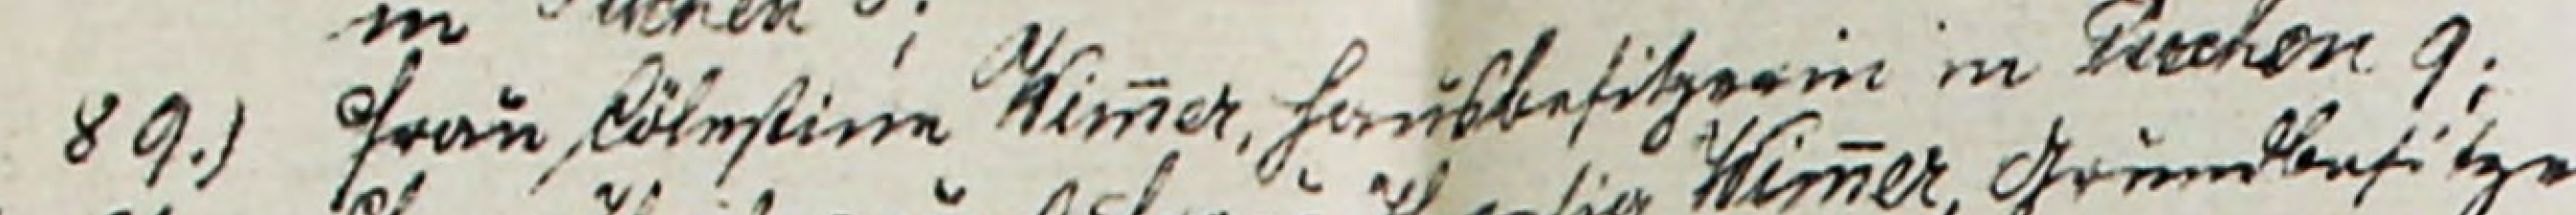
89.) Frau Cölestine Wimmer, Hausbesitzerin in Puchen 9;
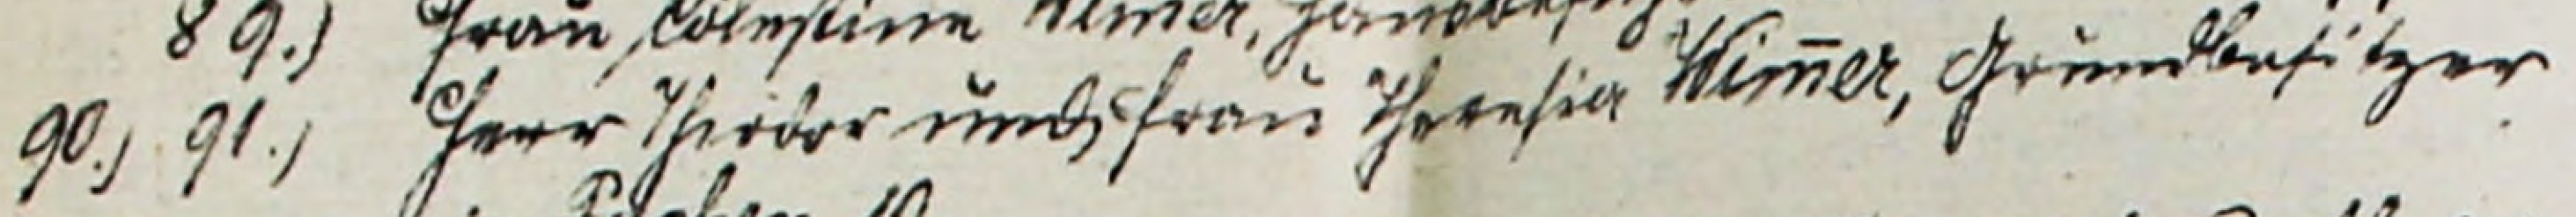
90.) 91.) Herr Theodor und Frau Theresia Wimmer, Grundbesitzer
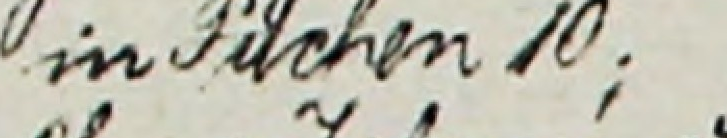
in Puchen 10;
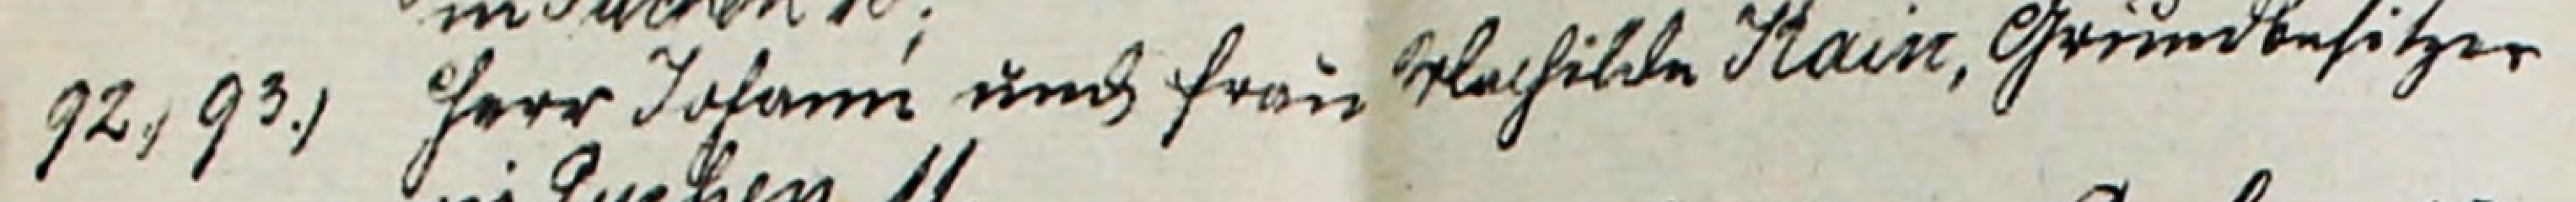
92.) 93.) Herr Johann und Frau Mathilde Kain, Grundbesitzer
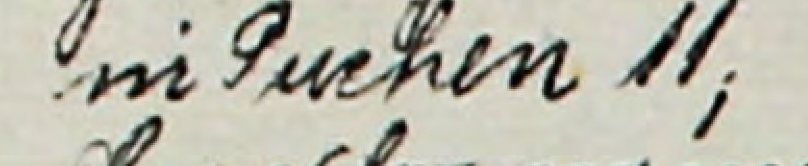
in Puchen 11;
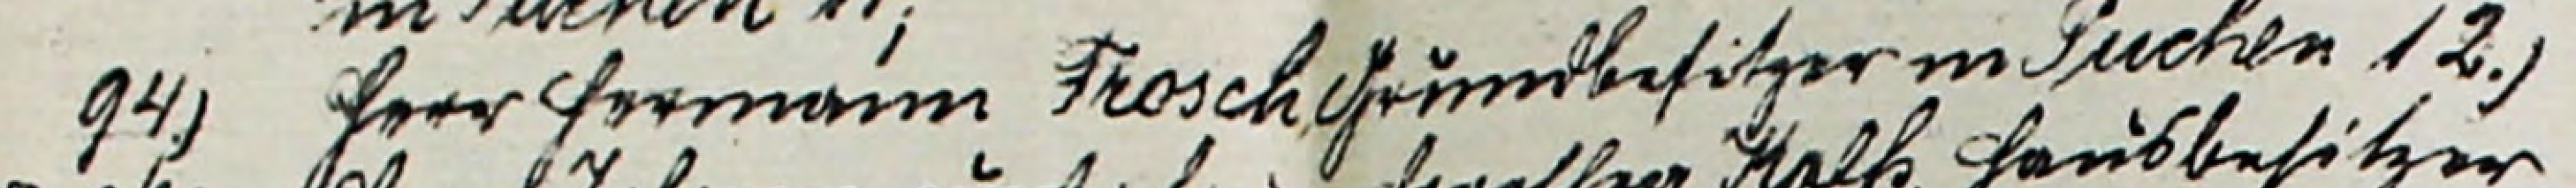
94.) Herr Hermann Frosch, Grundbesitzer in Puchen 12;
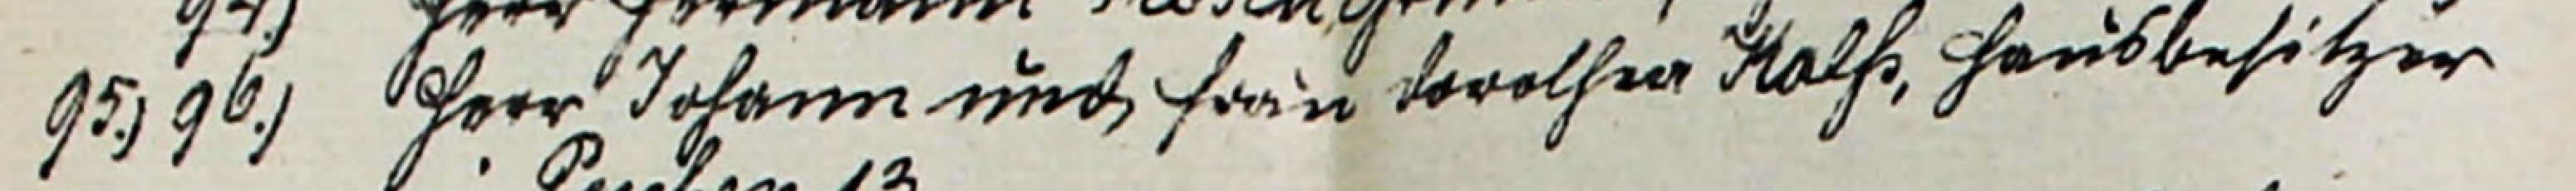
95.) 96.) Herr Johann und Frau Dorothea Kalhs, Hausbesitzer
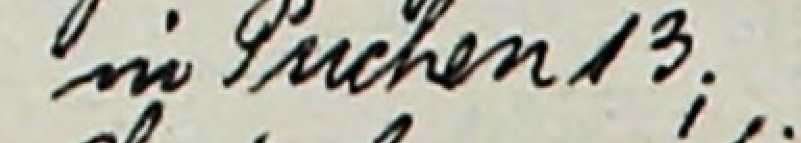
in Puchen 13.
